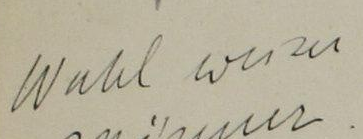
Wahl weiser
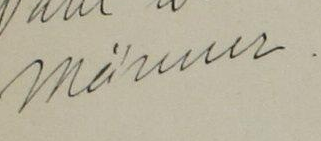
Männer
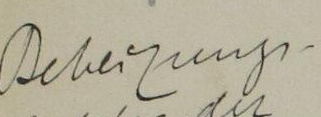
Beheizungs
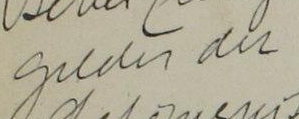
gelder der
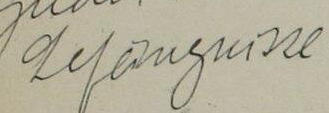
Gefängnisse
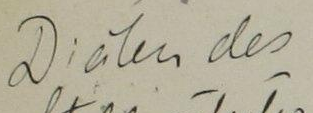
Diäten des
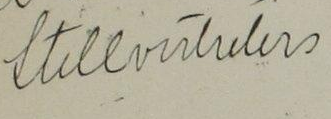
Stellvertreters
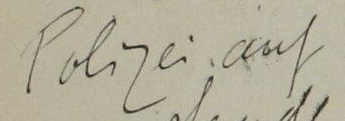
Polizei auf
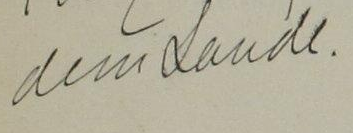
dem Lande.
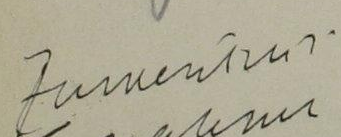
Zurkentnis
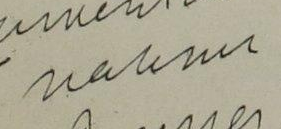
nahme
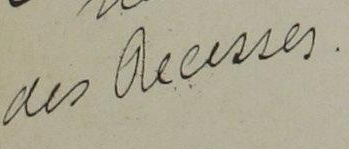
des Recesses
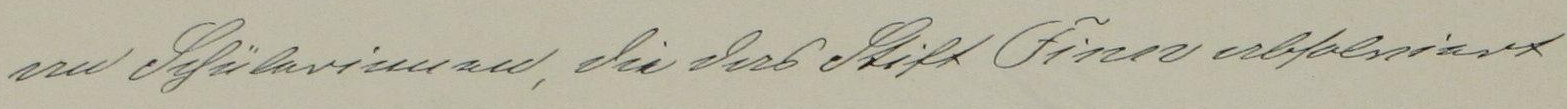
an Schülerinnen, die das Stift Finn absolviert
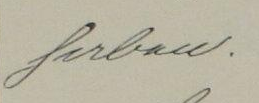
haben.
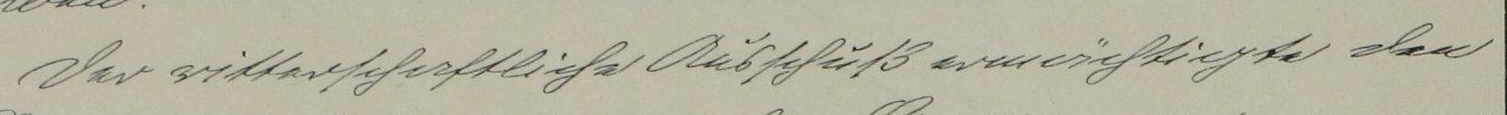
Der ritterschaftliche Ausschuß ermächtigte den
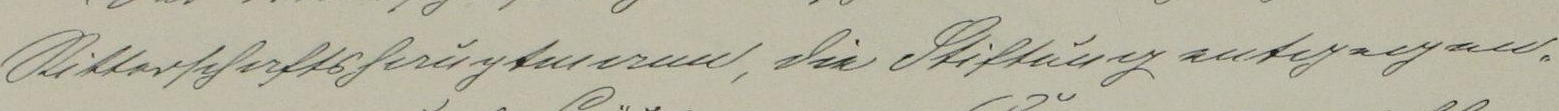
Ritterschaftshauptmann, die Stiftung entgegen-
